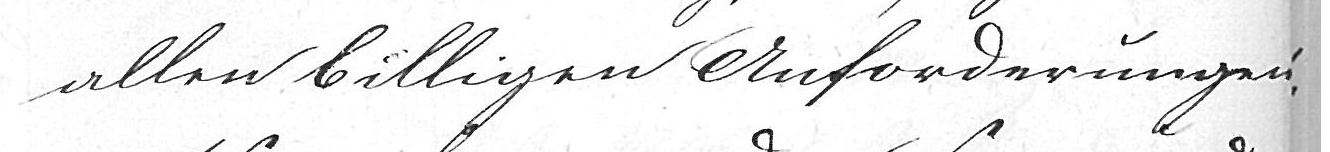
allen billigen Anforderungen
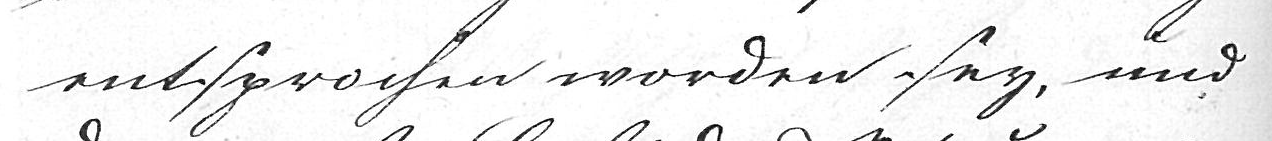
entsprochen worden sey und
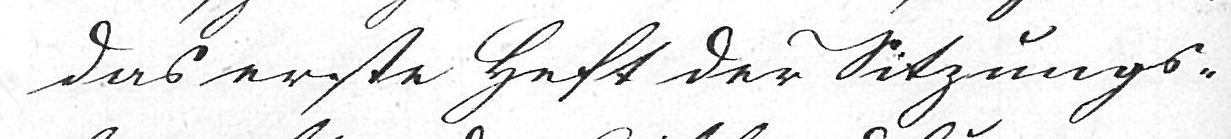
das erste Heft der Sitzungs-
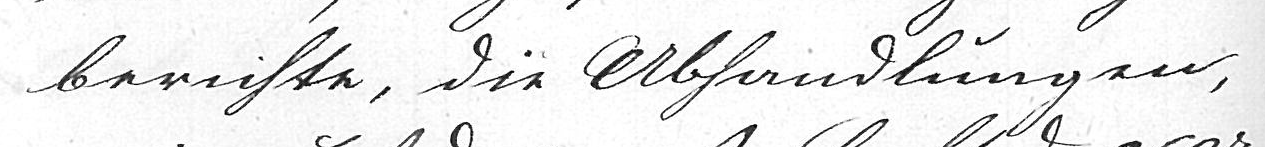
berichte, die Abhandlungen,
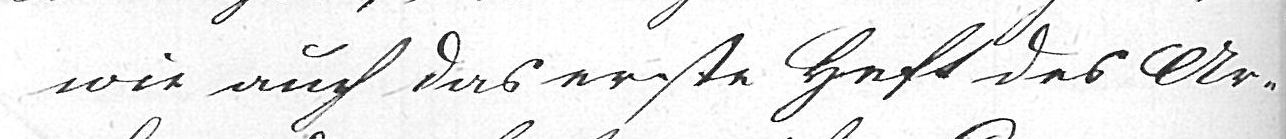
wie auch das erste Hefts des Ar-
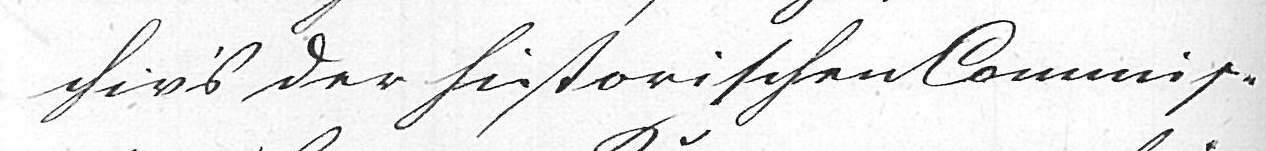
chivs der historischen Commis-
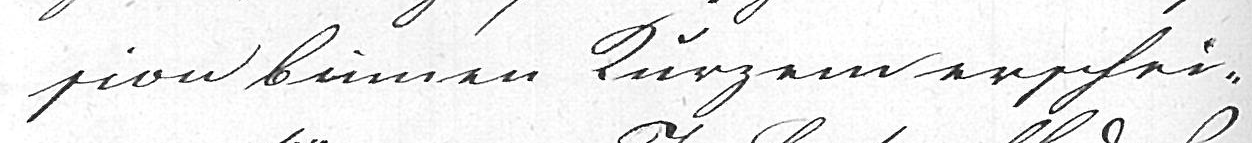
sion binnen kurzem erschei.
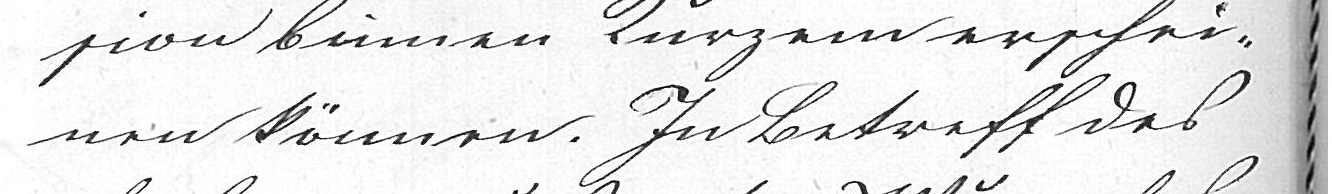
nen können. In Betreff des
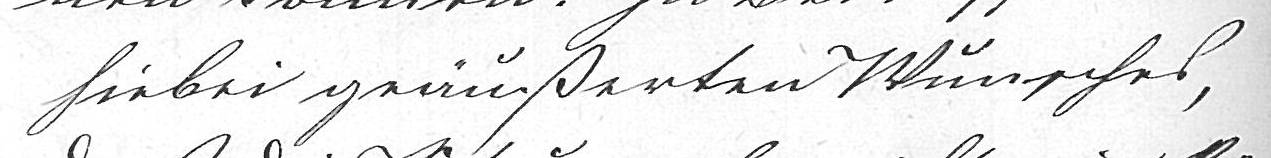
hiebei geäußerten Wunsches
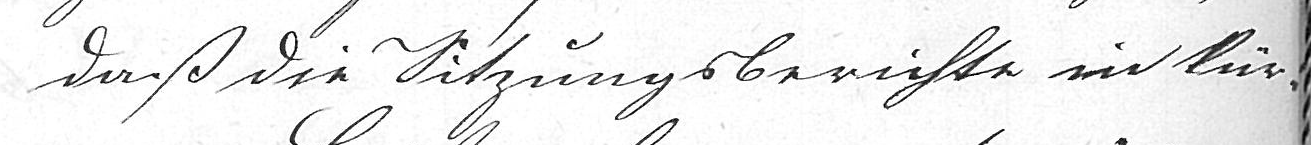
daß die Sitzungsberichte in kür-
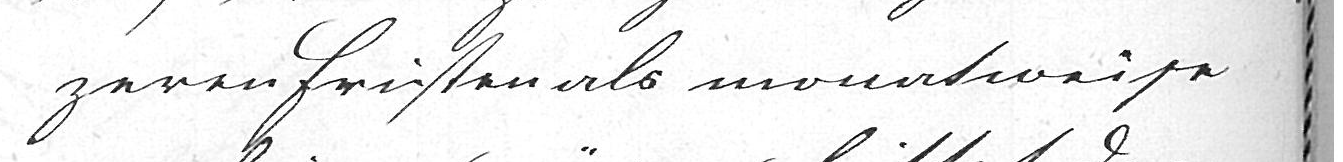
zeren Fristen als monatweise
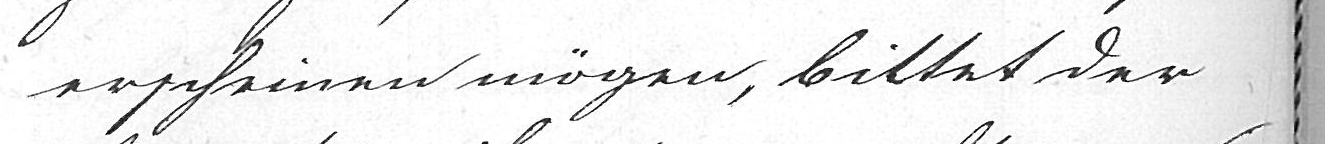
erscheinen mögen, bittet der
